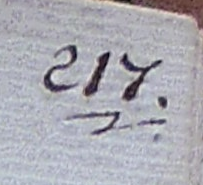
217.
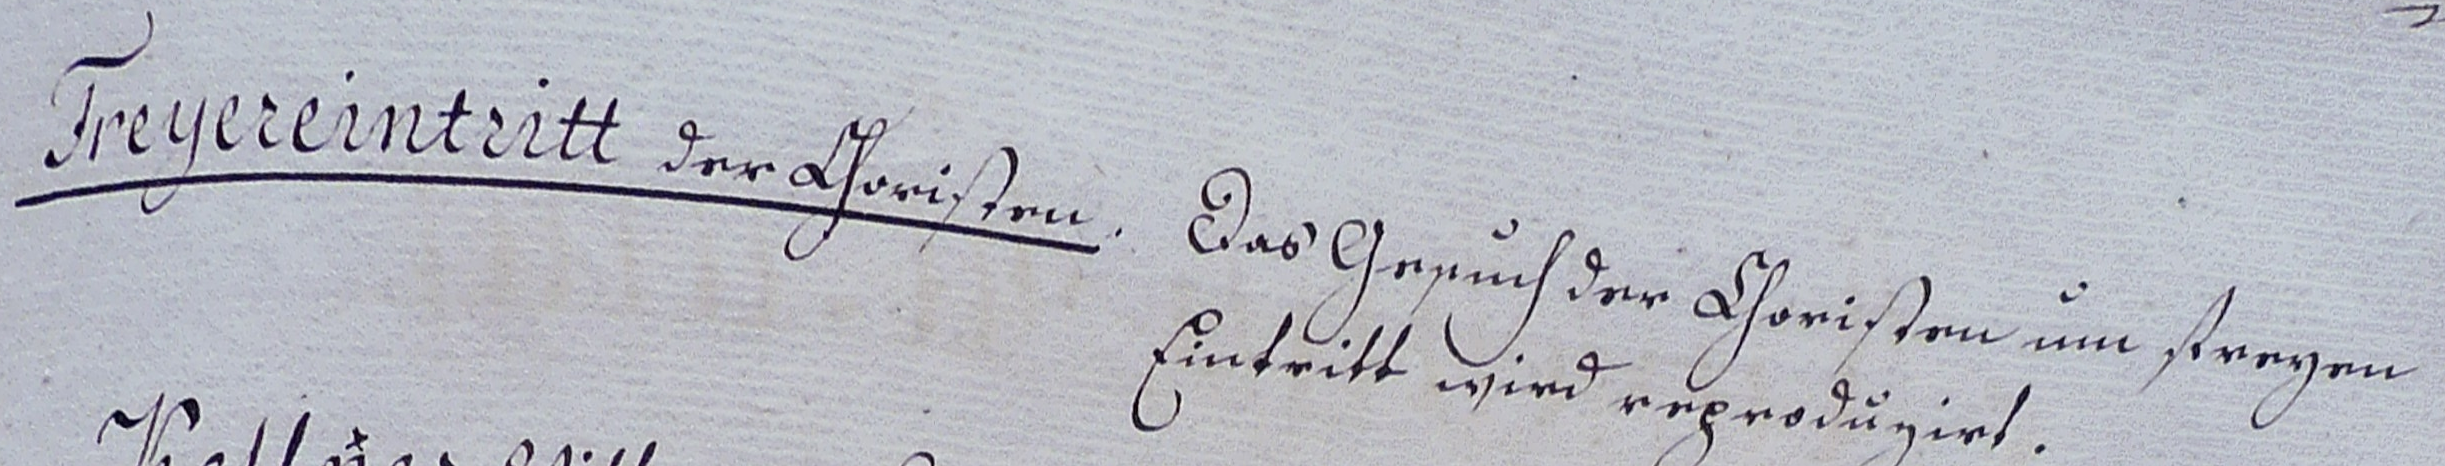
Freyereintritt der Choristen. Das Gesuch der Choristen um freyen
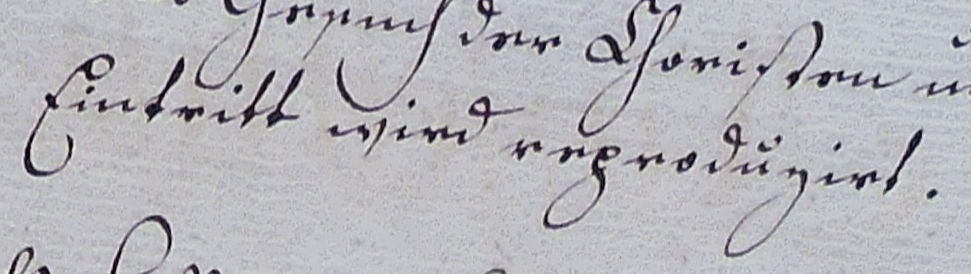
Eintritt wird reproduzirt.
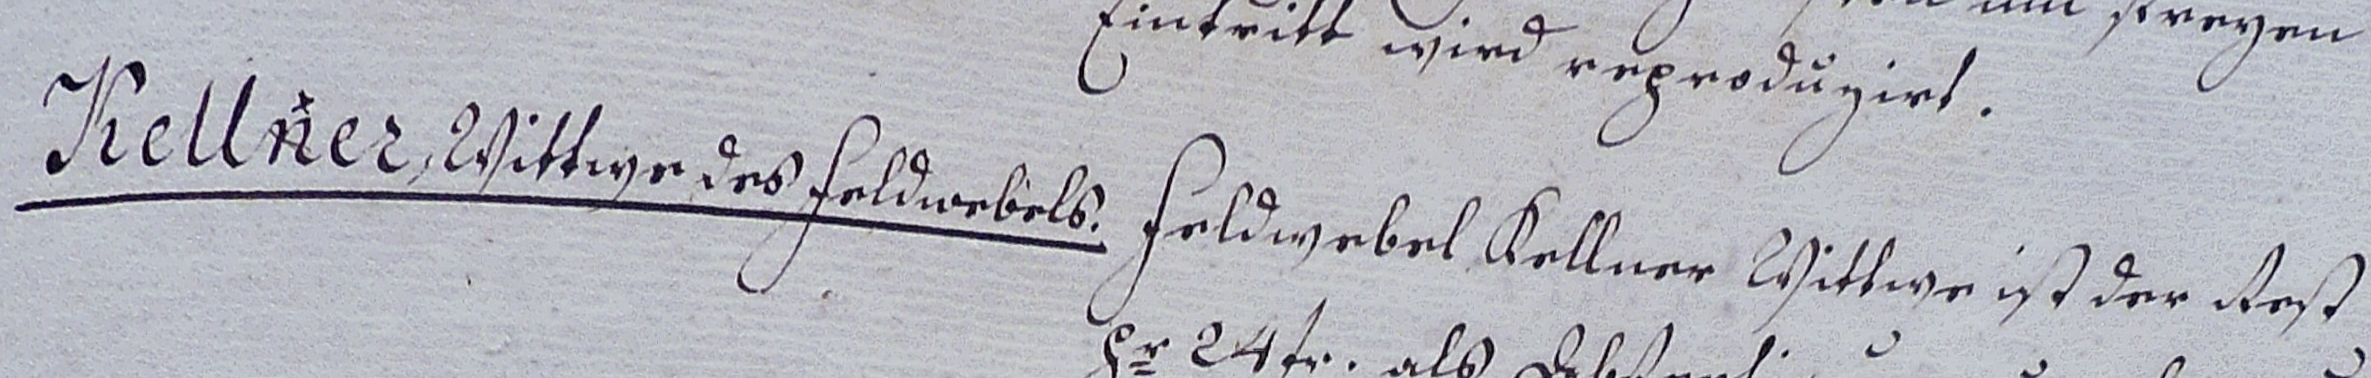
Kellner, Wittwe des Feldwebels. Feldwebel Kellner Wittwe ist der Rest
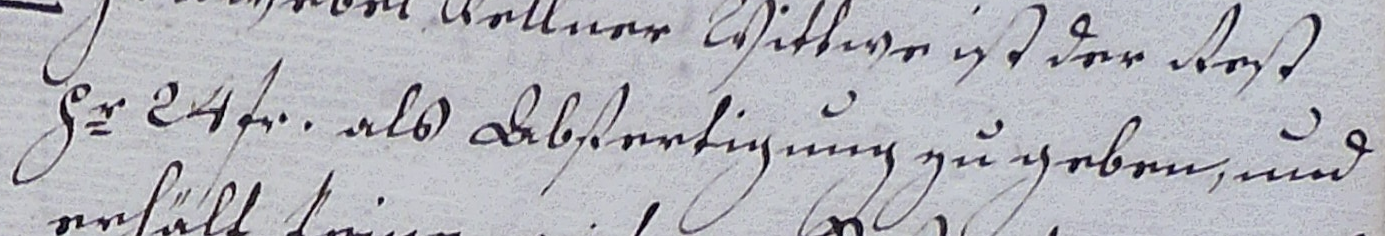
pr͇ 24fr. als Abfertigung zu geben, und
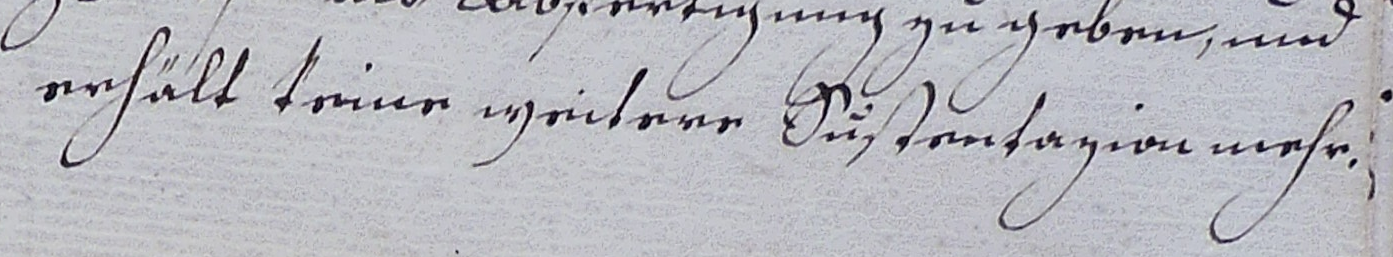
erhält keine weitere Sustentazion mehr.
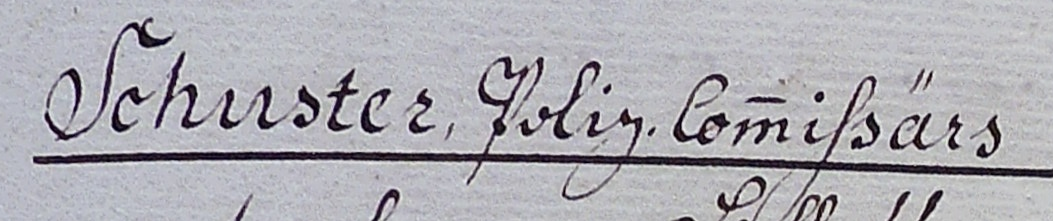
Schuster, Poliz. Com̅issärs
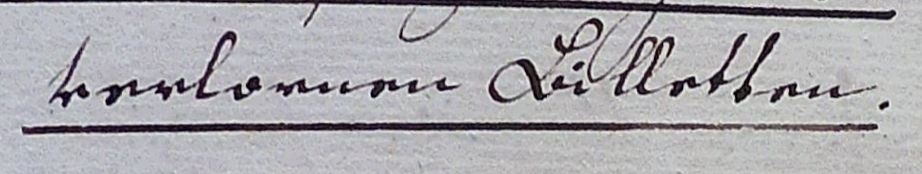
verlornen Billetten.
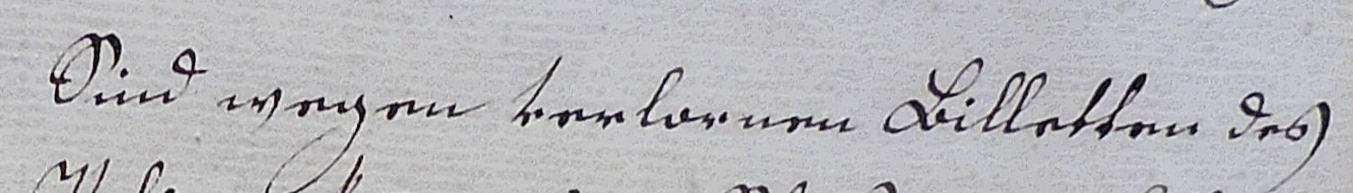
Sind wegen verlornen Billetten des
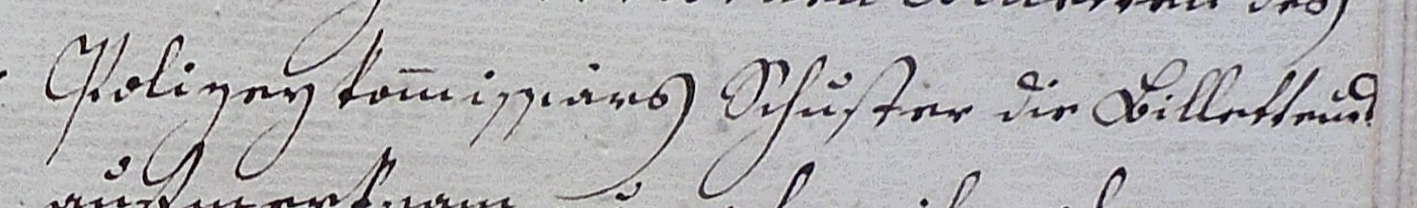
Polizeykom̅issärs Schuster die Billetteur
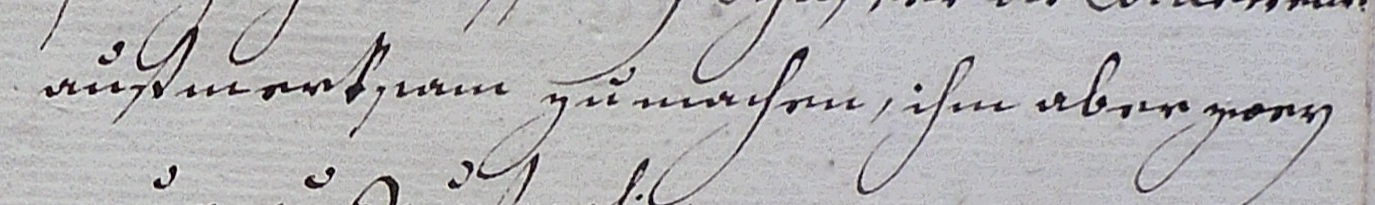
aufmerksam zu machen, ihm aber zwey
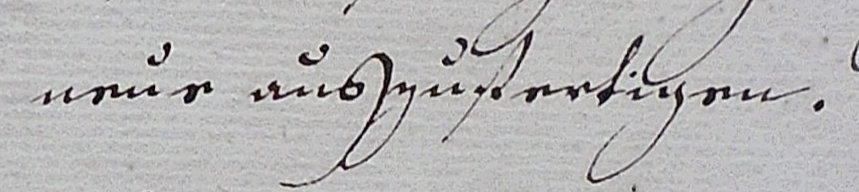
neue auszufertigen.
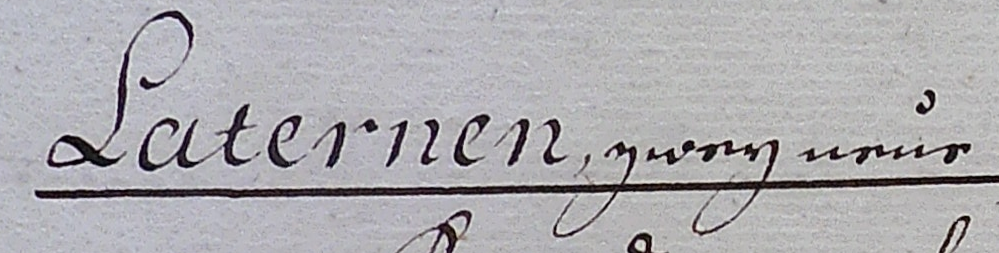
Laternen, zwey neue
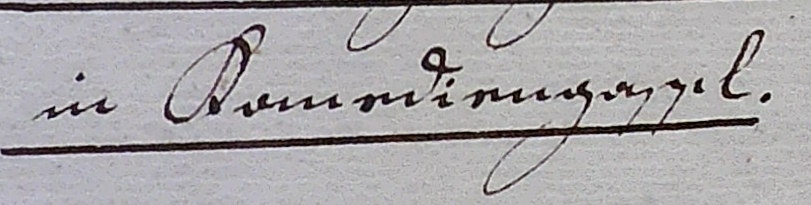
in Komediengassl.
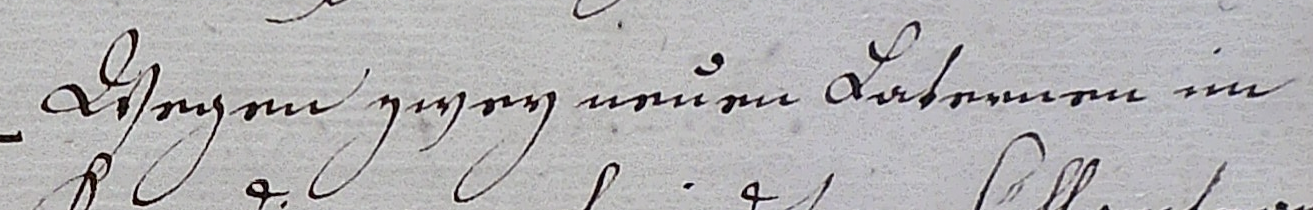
Wegen zwey neuen Laternen im
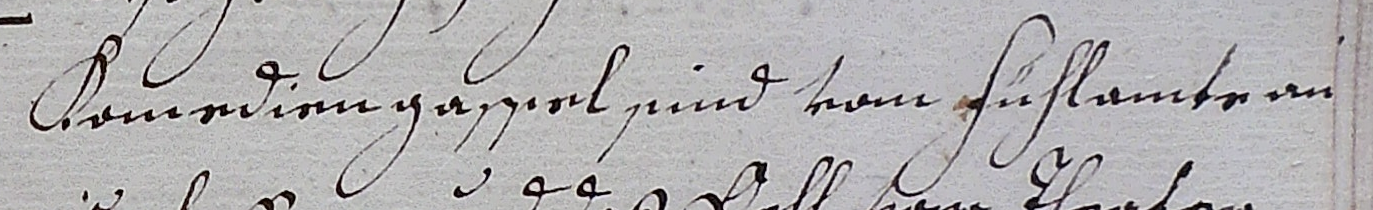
Komediengassel sind vom Füllamte an¬
